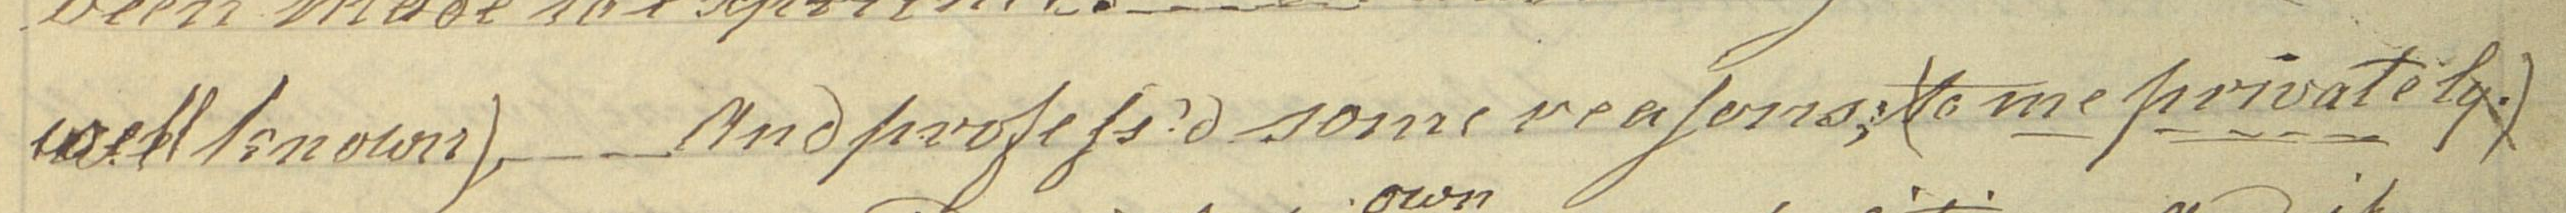well known) And profess'd some reasons; (to me privately.)
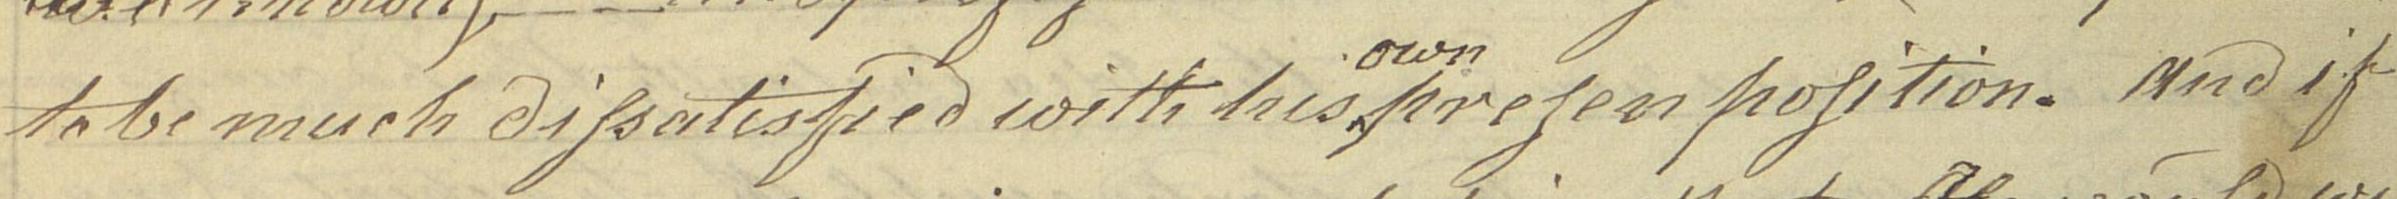to be much disatisfied with his ^ presen position. And if
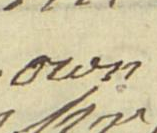own
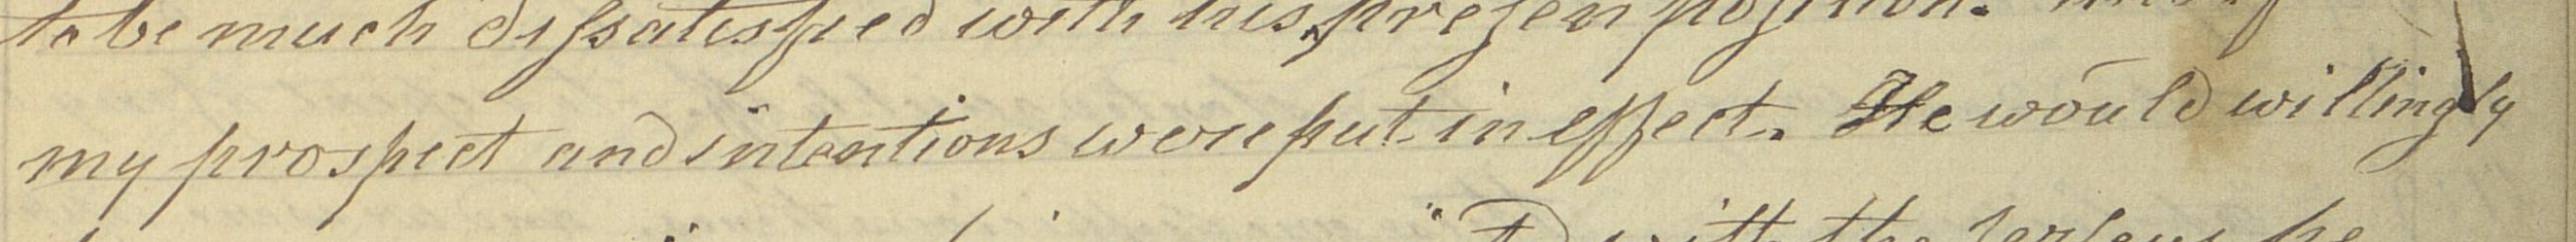my prospect and intentions were put in effect. He would willingly
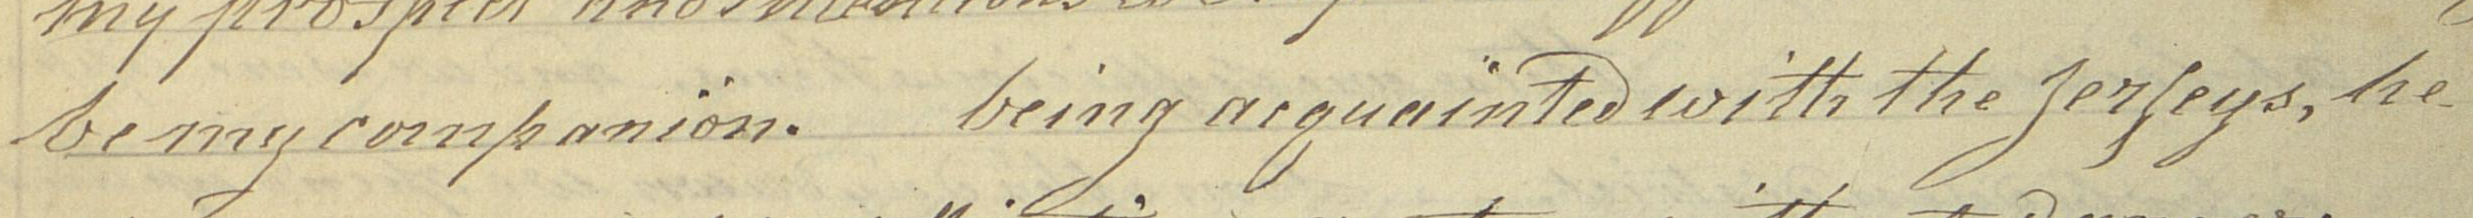be my companion. being acquainted with the Jerseys, he
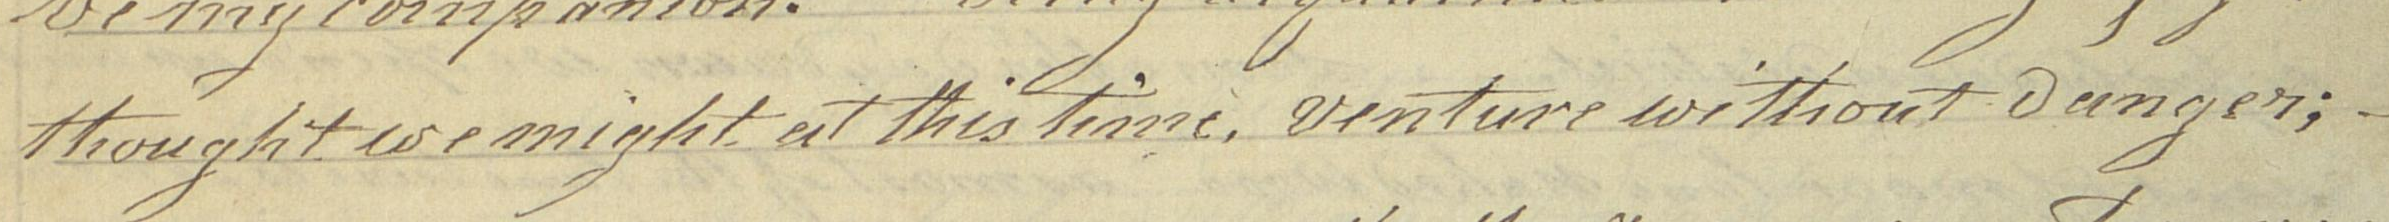thought we might at this Time. Venture without danger;
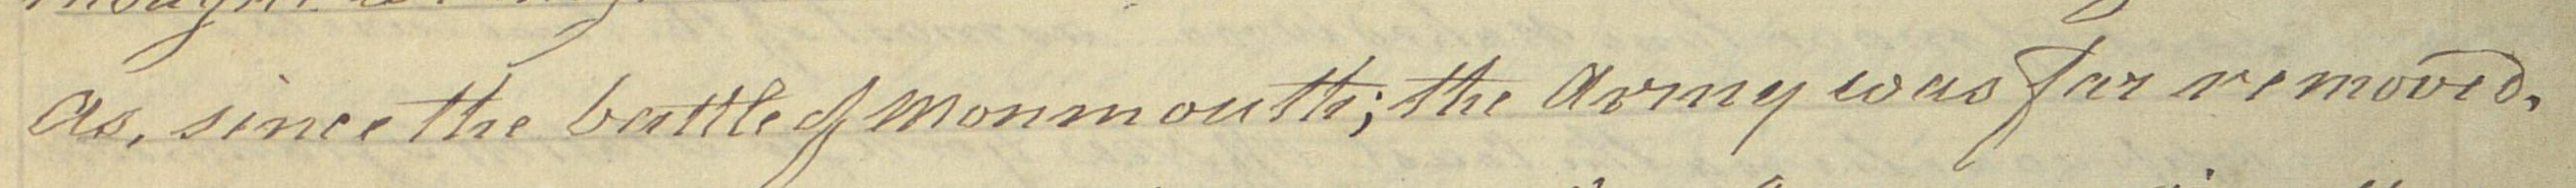as, since the battle of monmouth; the Army was far removed,
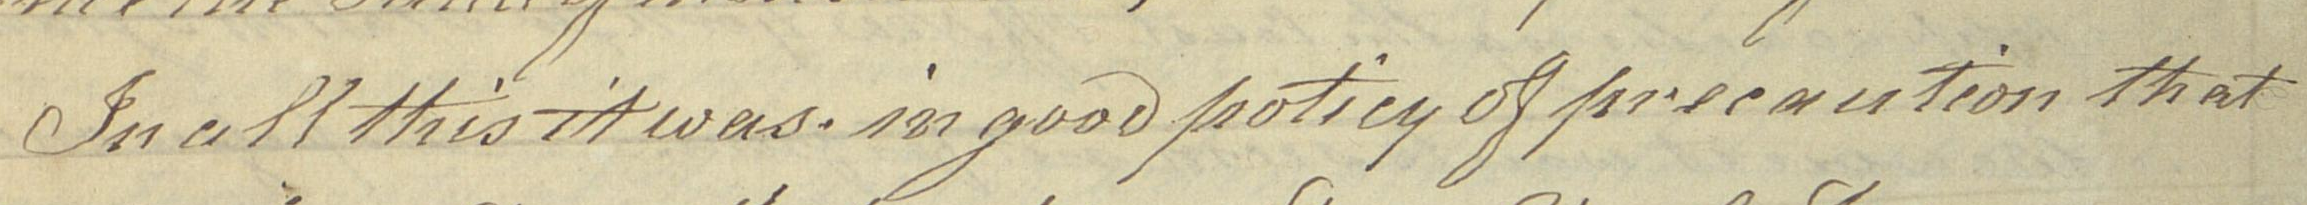In all this it was in good policy of precaution that
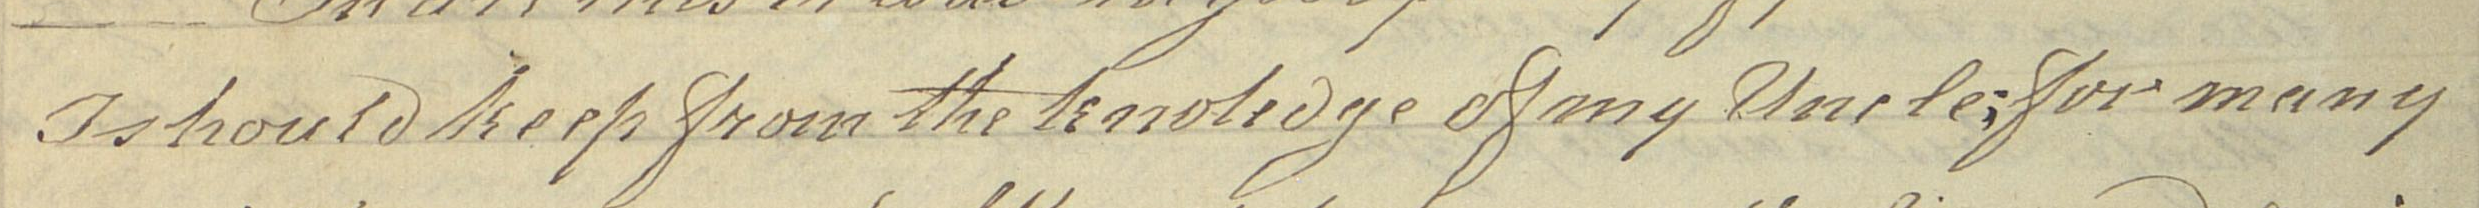I should keep from the knoledge of my Uncle; for many
